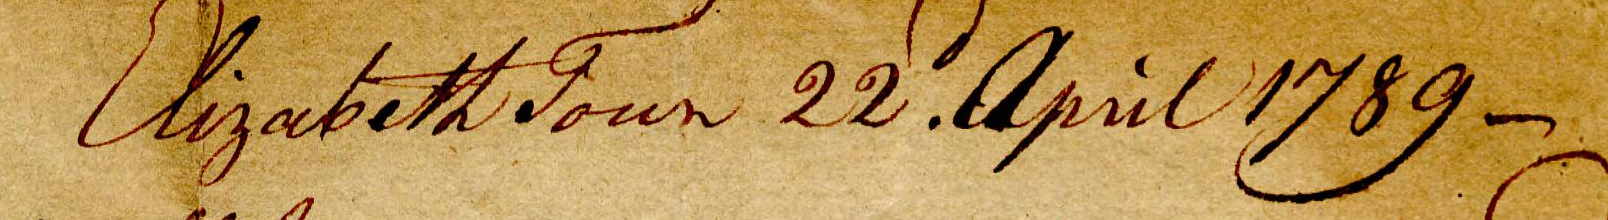Elizabeth Town 22^d. April 1789-
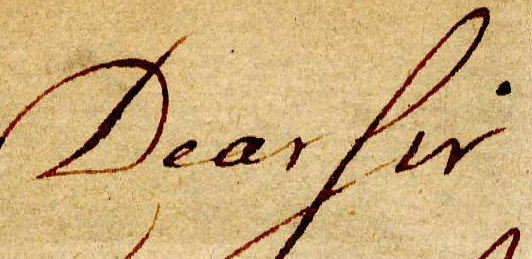Dear sir
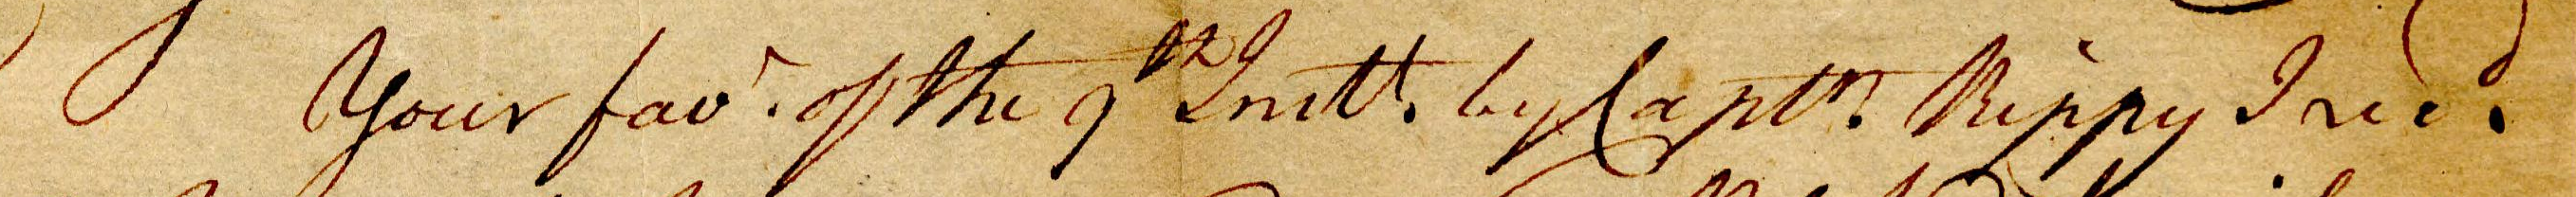Your fav^r of the 9^th Inst^t. by Capt^n. Rippy I rec^d.
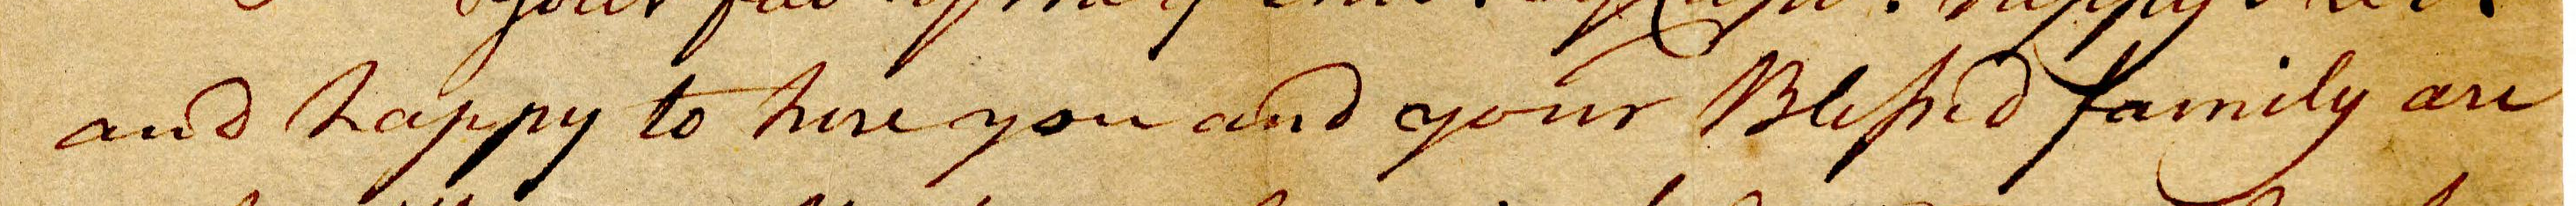and happy to here you and your Blessed family are
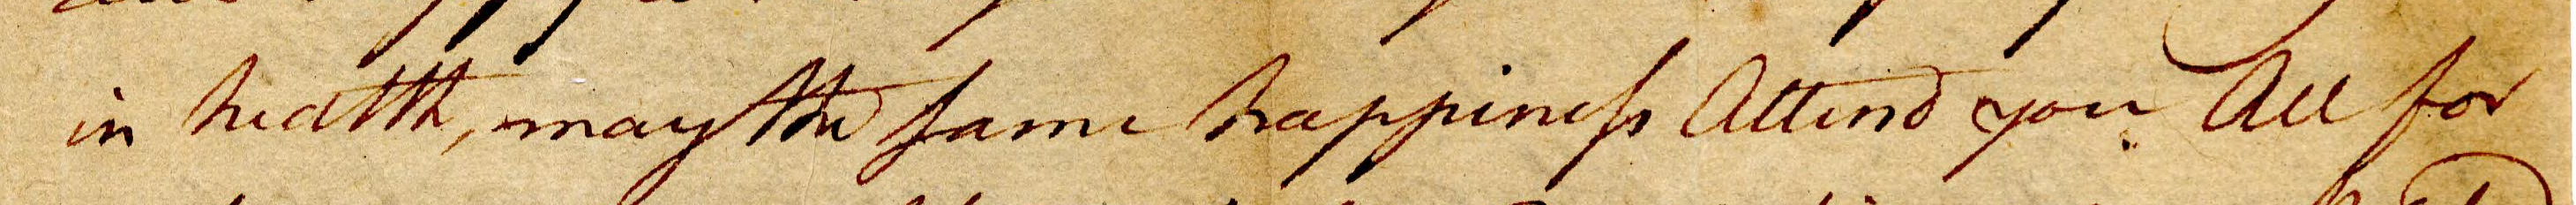in health may the same happiness Attend you all for
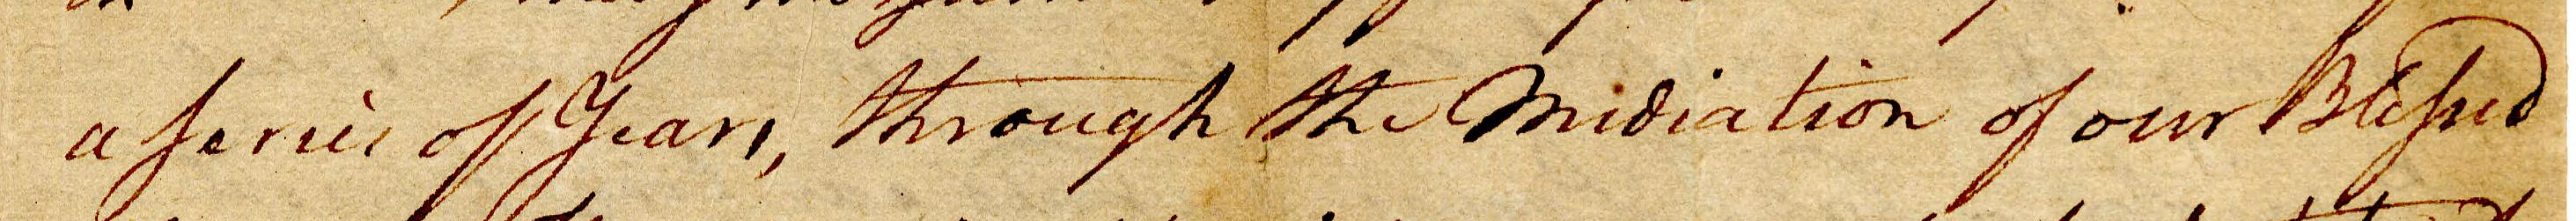a series of years, through the Midiation of our Blessed
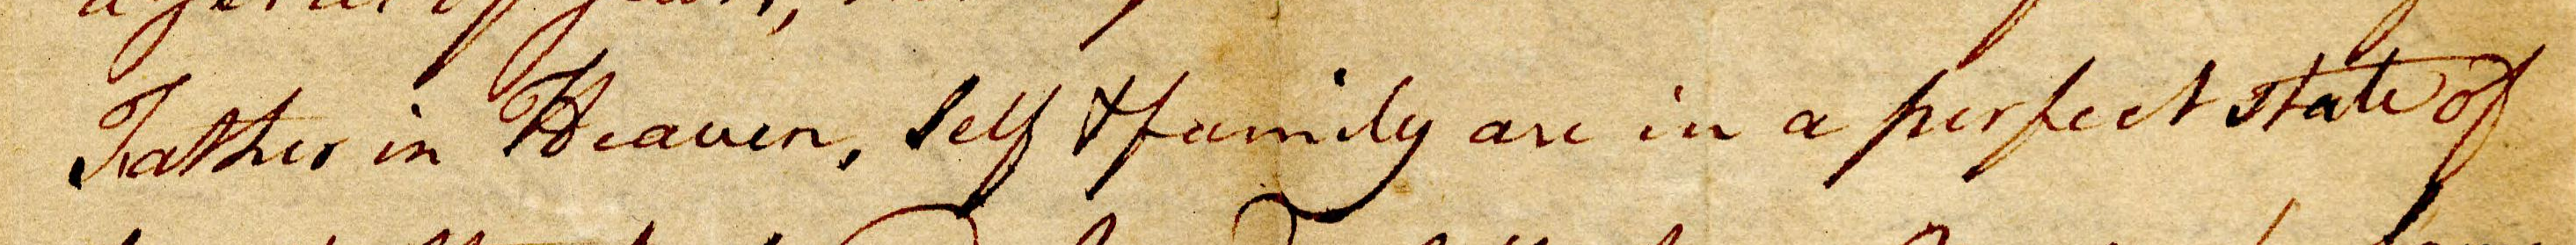Father in Heaven, self & family are in a perfect state of
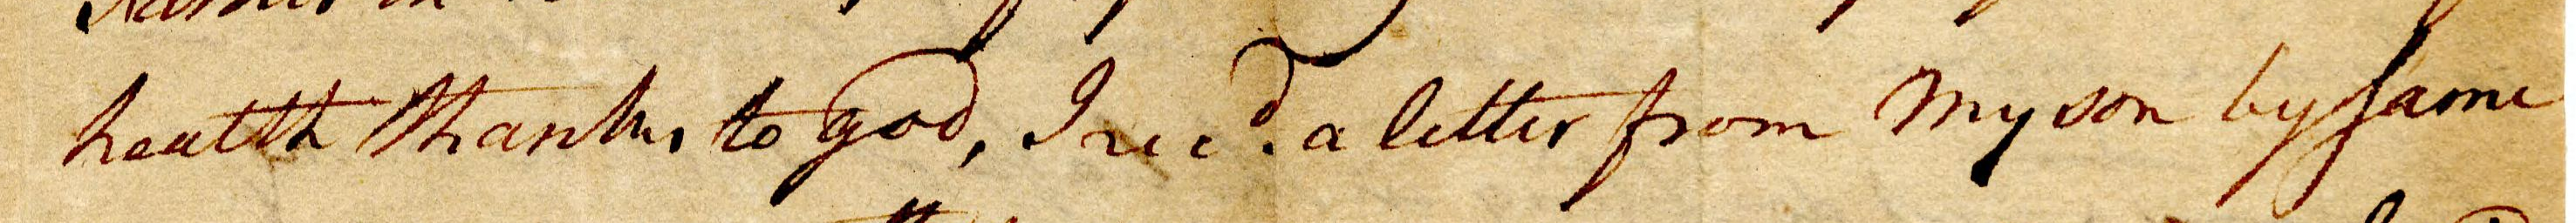health thanks to god, I rec^d. a letter from My son by same
